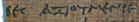βεϲ αξιουμενϲε
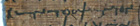βωντοοψωνιον
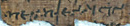μηειληφεναιϲυν
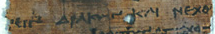ρεινδρακωνκαινεχθ
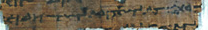πειδητωνλοιπωναπεχον
